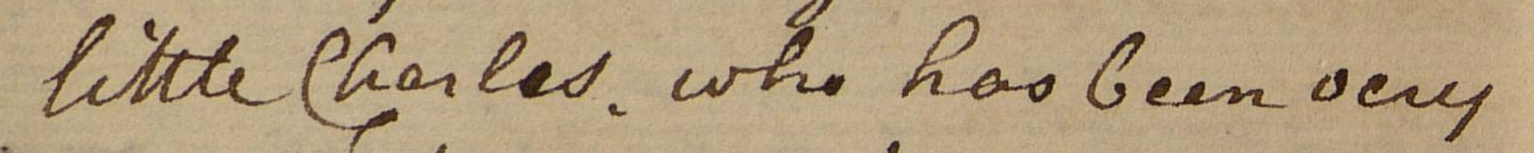little Charles, who has been very
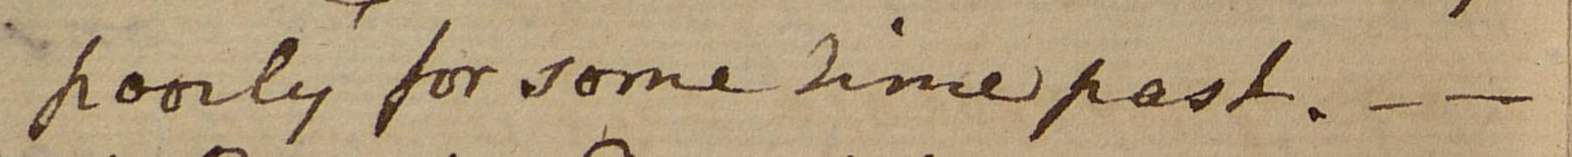poorly for some time past.--
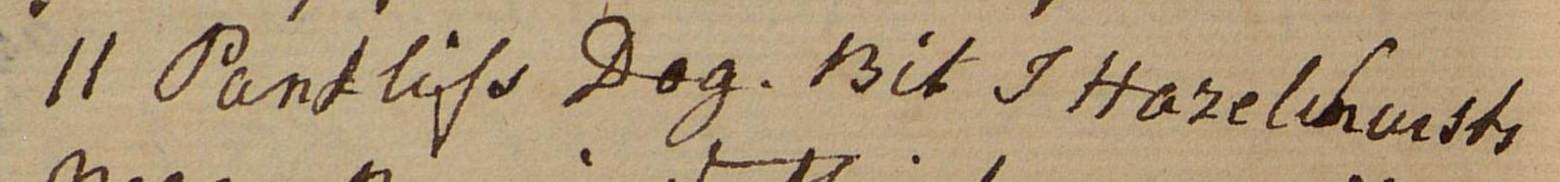11 Pantlifs Dog. Bit J Hazelhursts
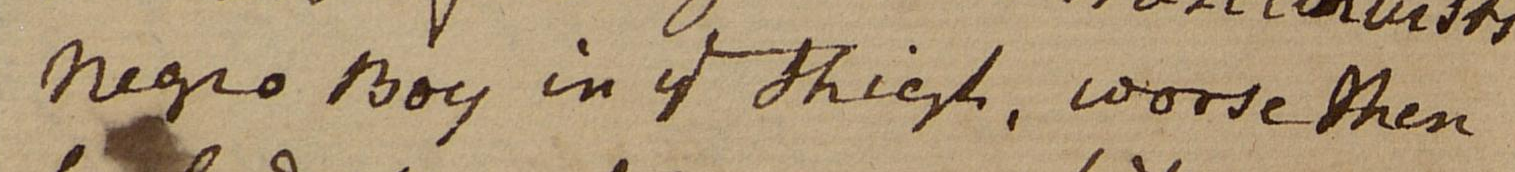Negro Boy in y^e thigh, worse then
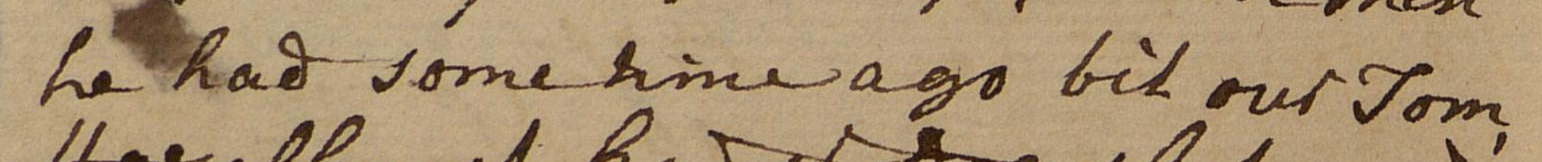he had some time ago bit our Tom
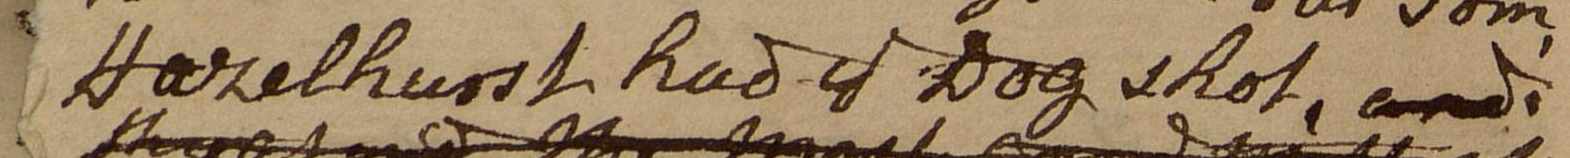Hazelhurst had y^e Dog shot, and
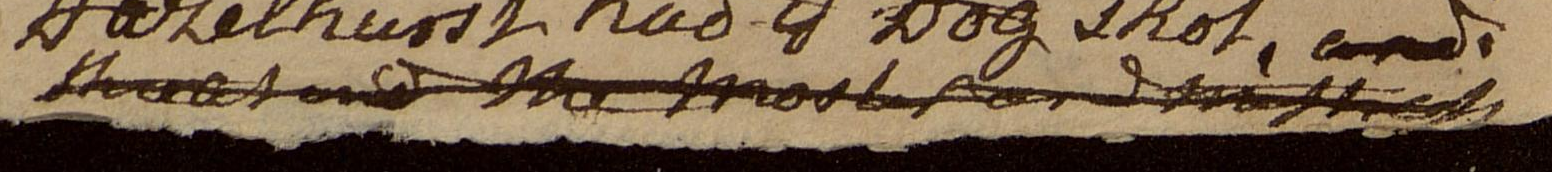[threat and the most ____________]
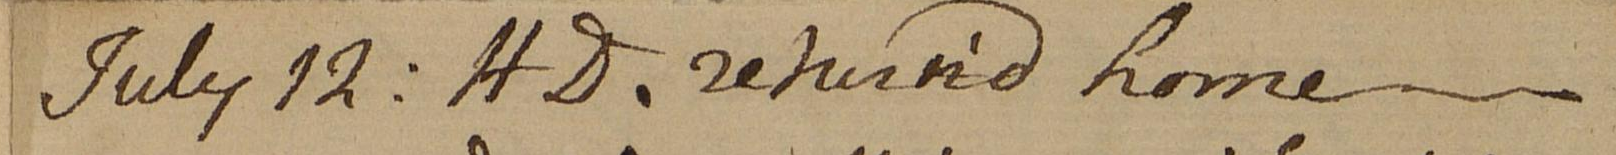July 12: H D. return'd home-
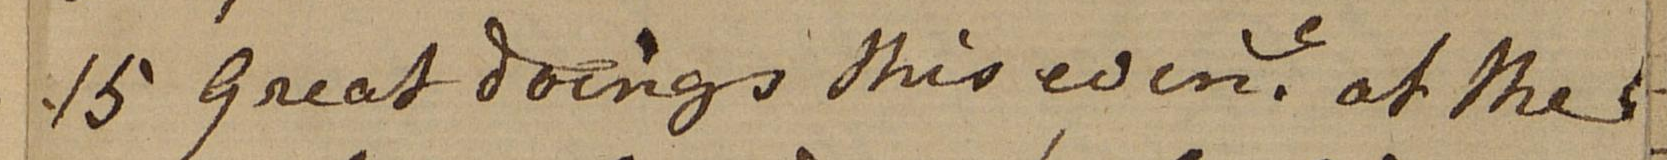15 Great doings this even^g. at the
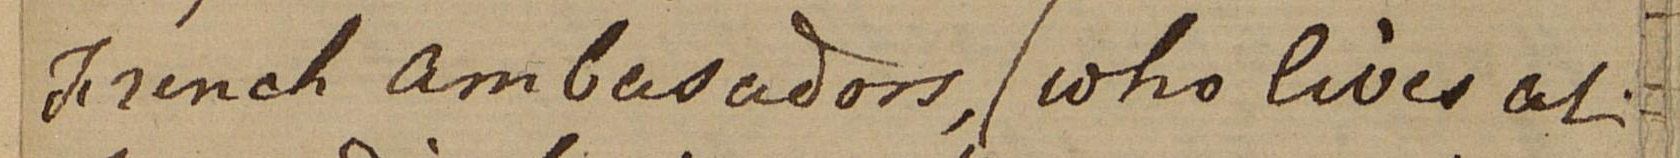French Ambasadors, (who lives at
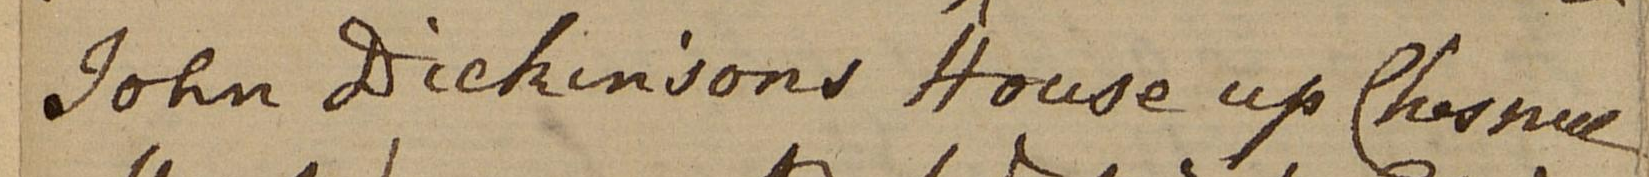John Dickinsons House up Chesnut
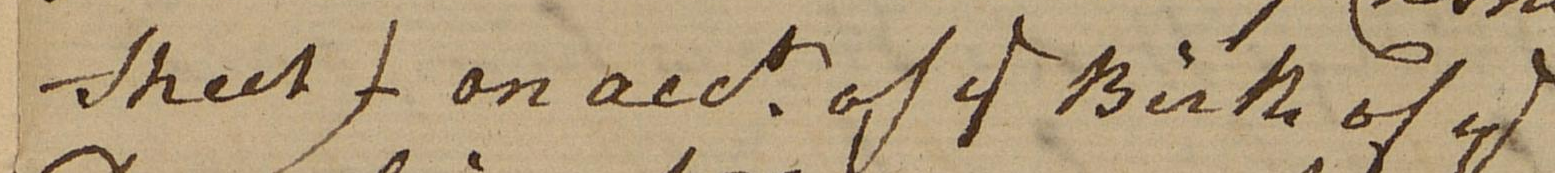-Street) - on acc^t. of y^e Birth of y^e
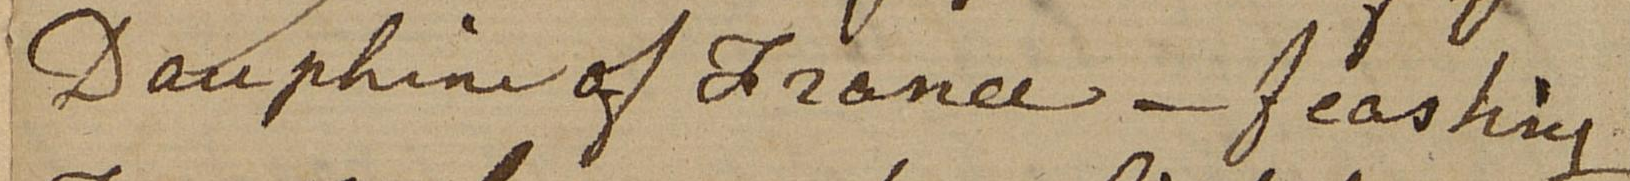Dauphin of France- feasting
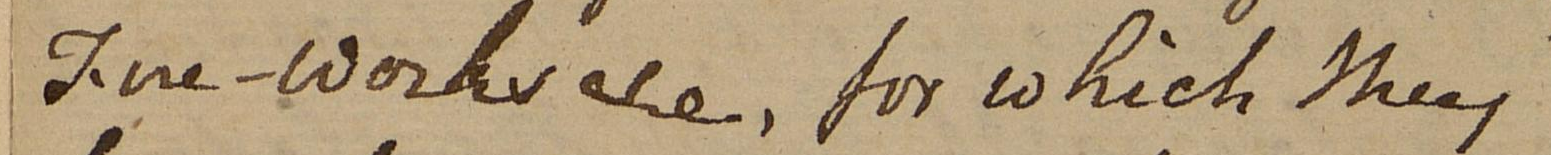Fire- Works &c, for which they
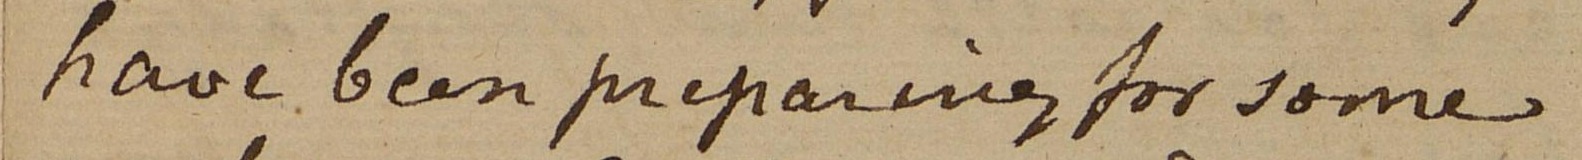have been preparing for some
